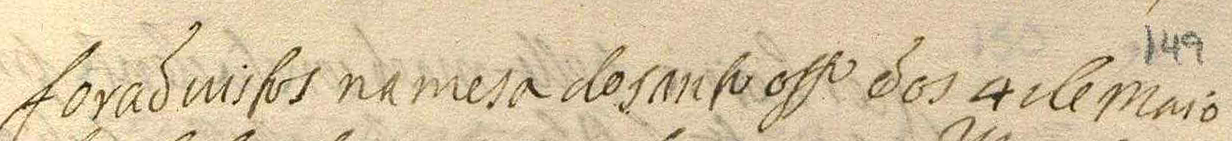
foraõ uistos na mesa do santo offo ē os 4 de maio
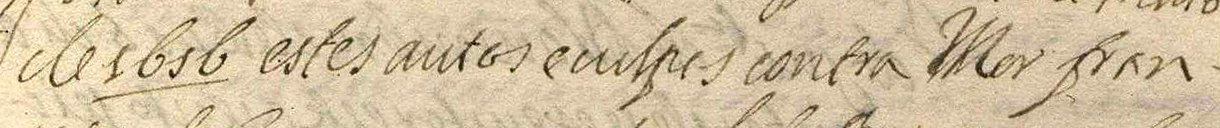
de 1656 estes autos e culpas contra Mor fran
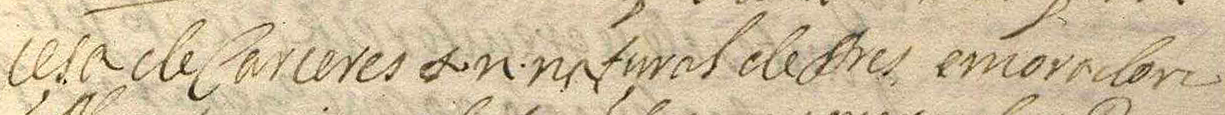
cesa de Carceres x n. natural de Ares, e moradora
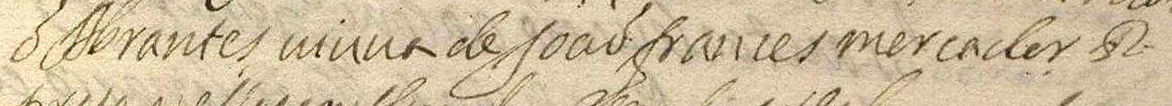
ē Abrantes uiuua de Joaõ frances mercador R
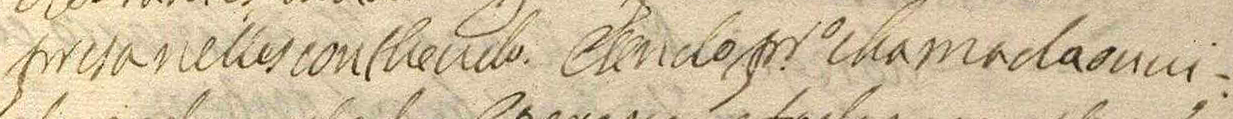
presa nelles contheudo. e sendo p.ro chamada ouui
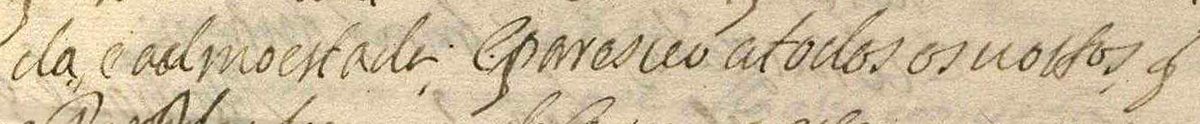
da, e admoestada; e paresceo a todos os uottos, q̄
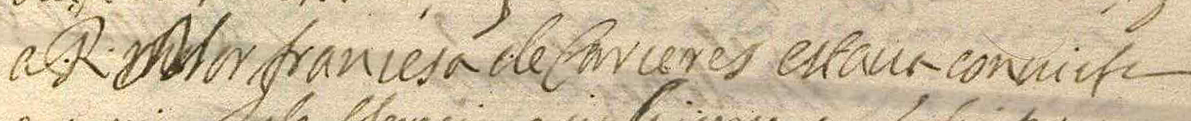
a R. Mor francesa de Carceres estaua conuicta
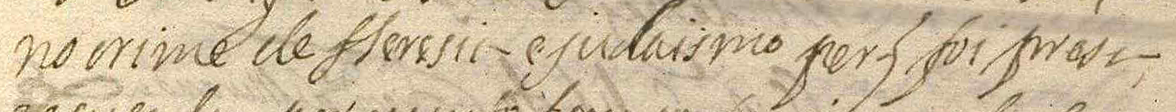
no crime de Heresia e judaismo per q̄ foi presa
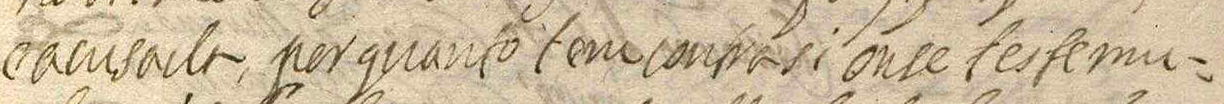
e acusada, perquanto tem contra si onse testemu
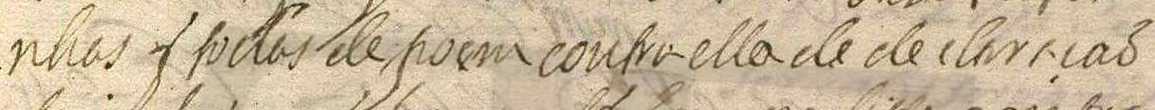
nhas q̄ todas depoem contra ella de declaraçaõ
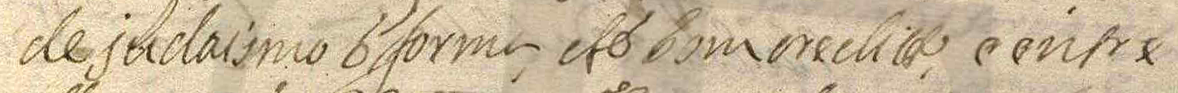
de judaismo ē forma, e tē bom creditto, e entre
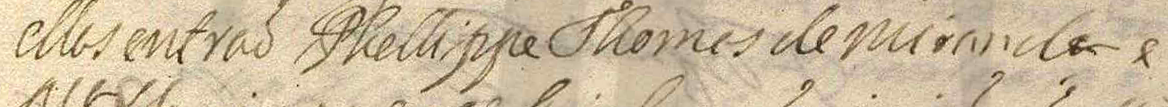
elles entraõ Phellippe Thomas de miranda, e
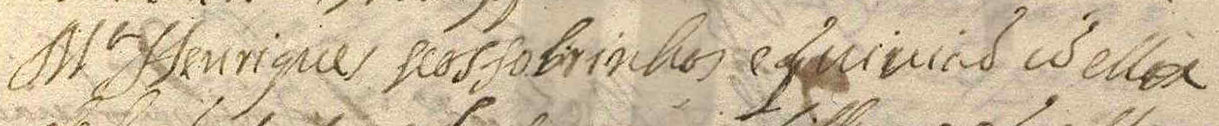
Ma Henriques seos sobrinhos e q̄ uiuiaõ cō ella
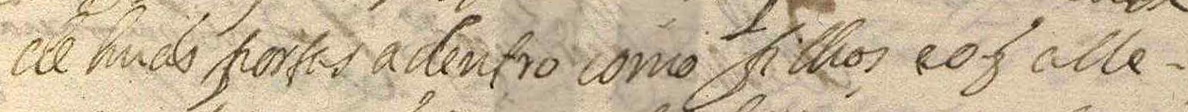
de huās portas a dentro como filhos, e o q̄ alle
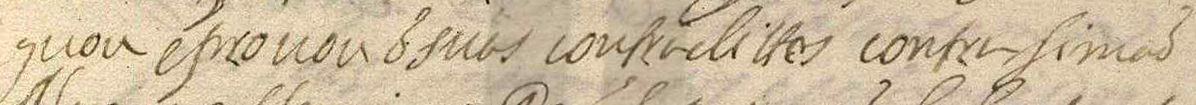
guou e prouou ē suas contradittas contra simaõ
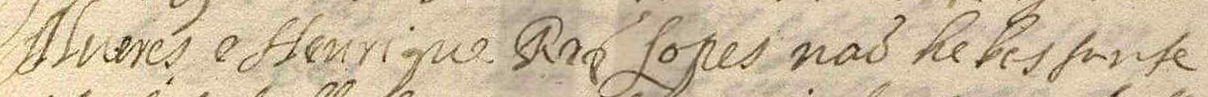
Alueres, e Henrique Rroz̄ Lopes naõ he bastante
